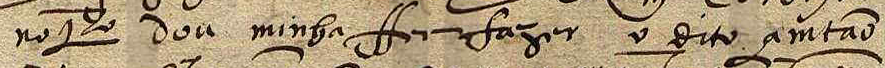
notro dou minha ffee fazer o dito amtão
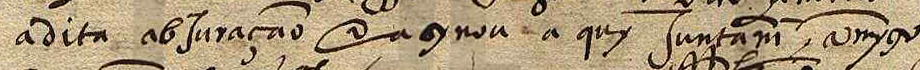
a dita abJuração e asynou aquy Juntamte c̄omygo
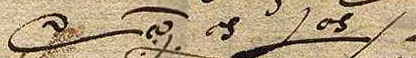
e cō as tas /
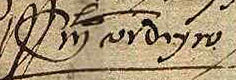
mel cordeyro
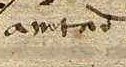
amtaõ
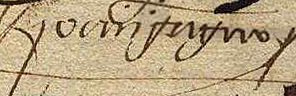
yoam gaguo
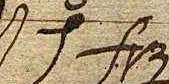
po frz
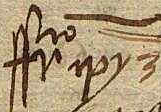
ffrco pyz
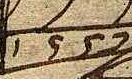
1552
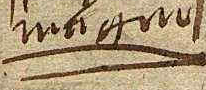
magno
